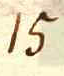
15
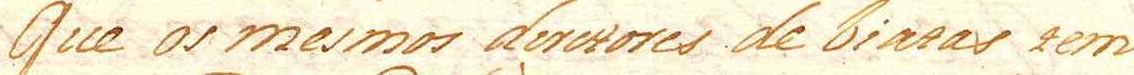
que os mesmos diretores de biatas tem
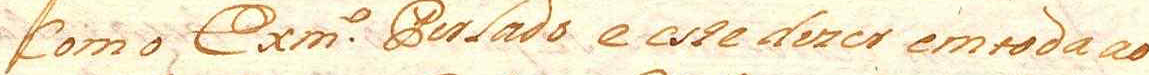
Como exm.o PerLado e este dizer em toda a o
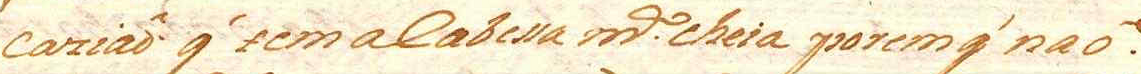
caziaõ q̄ tem a Cabessa m.to cheia porem q̄ naõ
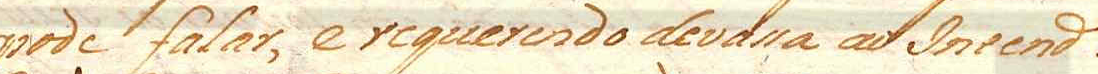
pode faLar, e requerendo devassa ao Intend.e
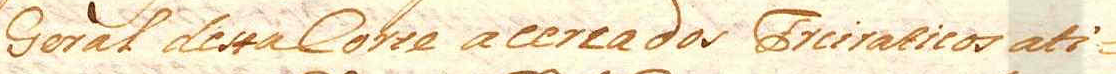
Geral desta Corte acerca dos Freiraticos ati
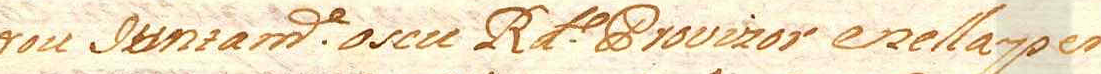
rou juntam.te o seu Rd̄.o Provizor e nella per
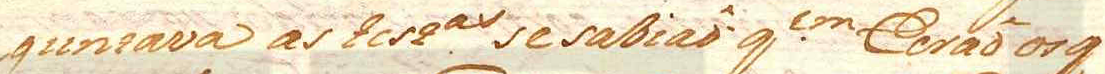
guntava as test.as se sabiaõ q.em heraõ os q̄
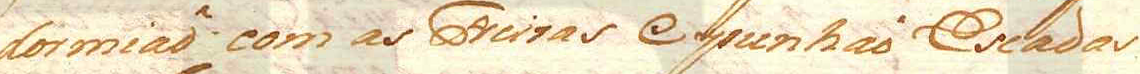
dormiaõ com as Freiras e punhaõ Escadas
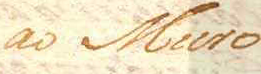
ao Muro
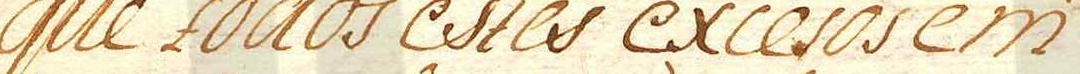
que todos estes excesos e m.tos
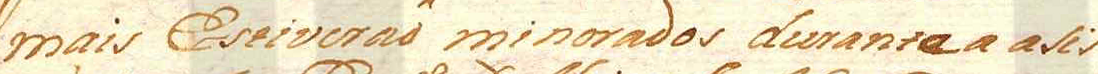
mais Estiveraõ minorados durante a asis
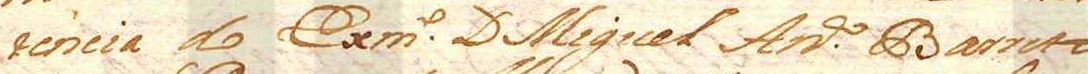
tencia do Exm.o D Miguel An.to Barreto
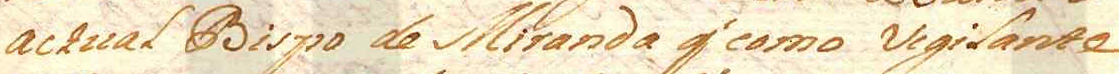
actuaL Bispo de Miranda q̄ como vigiLante
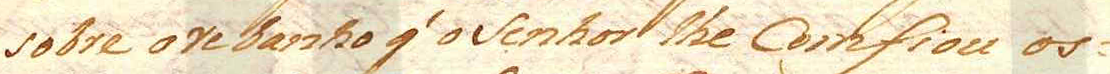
sobre o rebanho q̄ o senhor lhe Comfiou os
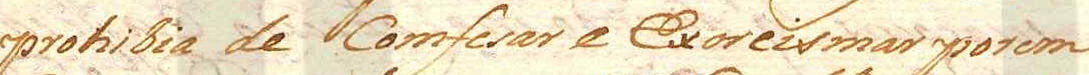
prohibia de Comfesar e Exorcismar porem
